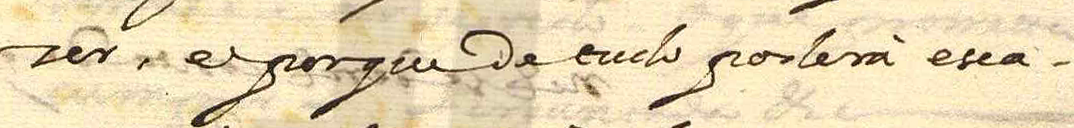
zer, e porque de tudo poderá esca
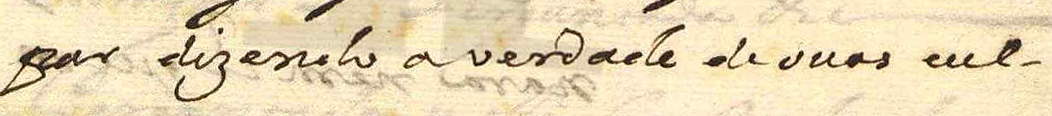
par dizendo a verdade de suas cul
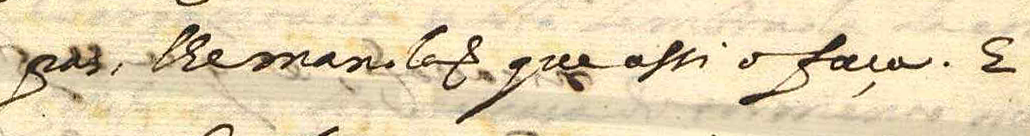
pas, lhe mandaõ que assi o faça. E
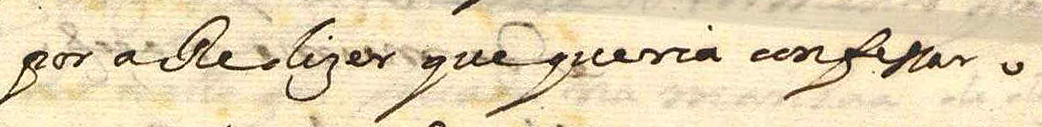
por a Re dizer que queria confessar o
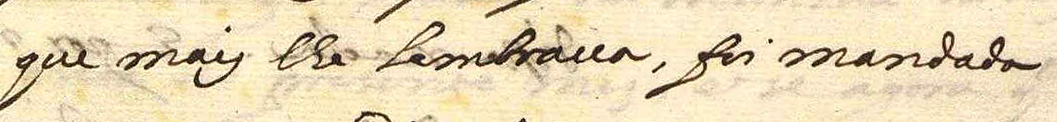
que mais lhe lembraua, foi mandada
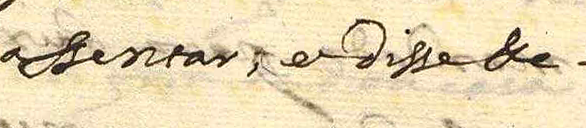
assentar, e disse &c
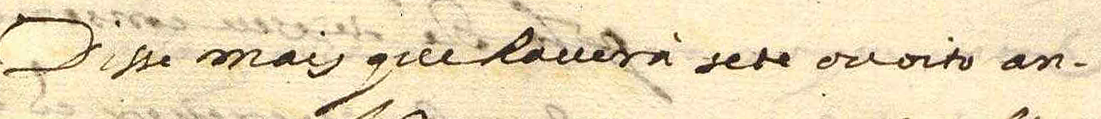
Disse mais que hauerá sete ou oito an
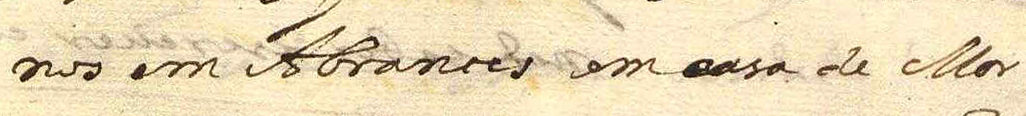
nos em Abrantes em casa de Mor
